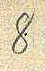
8
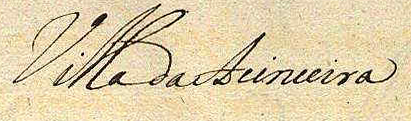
Villa da Acinceira
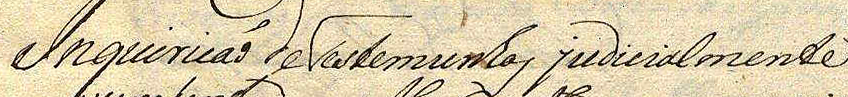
Inquiriçaõ de Testemunhas judicialmente
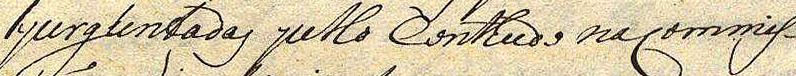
perguntadas pello Conthudo na Commis
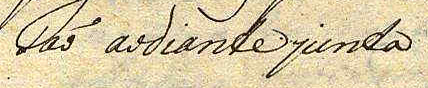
saõ aodiante junta
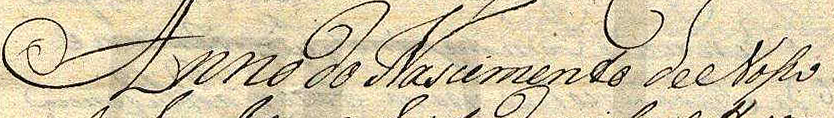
Anno do Nascimento de Nosso
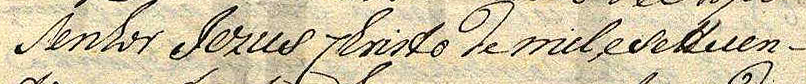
Senhor Iezus Christo de mil, e settecen
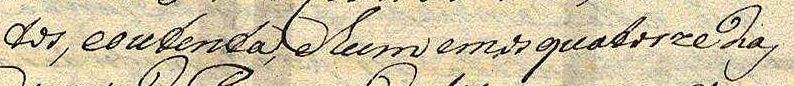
tos, e outenta, e hum em os quatorze dias
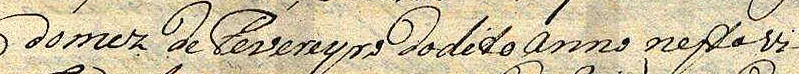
do mez de Fevereyro do dito anno nesta vi
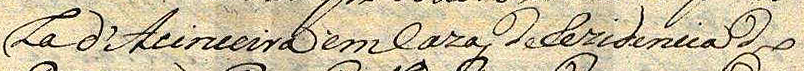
La d'Acinceira em caza de Rezidencia do
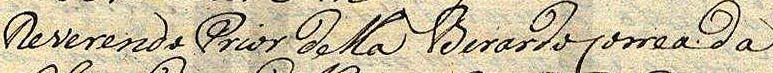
Reverendo Prior della Berardo Correa da
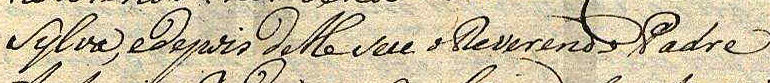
Sylva, e depois delle seu o Reverendo Padre
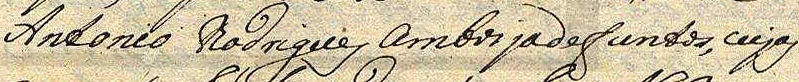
Antonio Rodrigues ambos ja defuntos, cujas
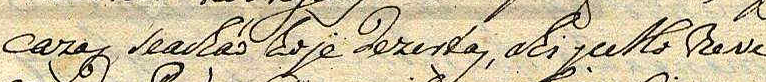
cazas se achaõ hoje dezertas, ahi pello Reve
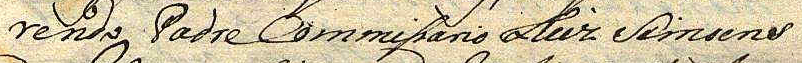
rendo Padre Commissario Luiz Simoens
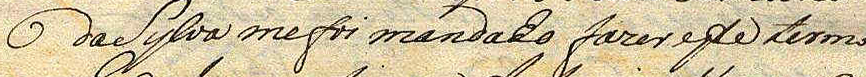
da Sylva me foi mandado fazer este termo
